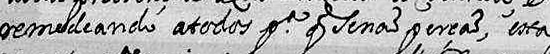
remedeando a todos p.a q̄ se naõ percaõ, esta
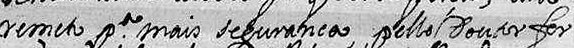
remeto p.a mais segurança, pello Doutor fer
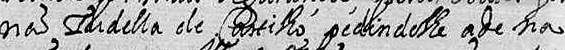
naõ Tudella de Castilho, pedindolhe a de na
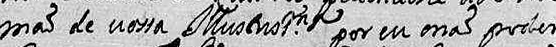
maõ de uossa Illustriss.ma por eu o naõ poder
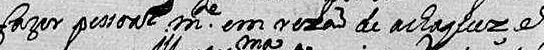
fazer pessoalm.te em rezaõ de achaquez, e o
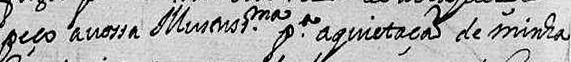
peço a uossa Illustriss.ma p.a aquietaçaõ de minha
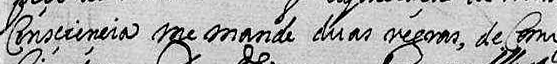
Consciencia me mande duas regras, de Como
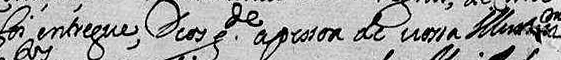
foi entregue, Deos g.de a pessoa de uossa Illustriss.ma
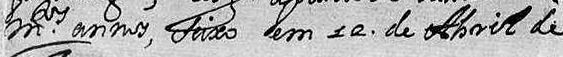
m.tos annos, Seixo em 12. de Abril de
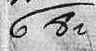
682
